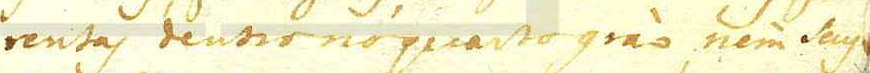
rentas dentro no quarto grāo, nem seus
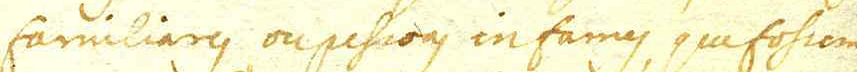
familiares, ou pessoas infames, que fossem
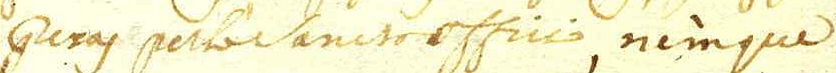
prezas pello Sancto officio, nem que
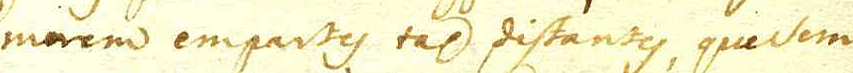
morem em partes taõ distantes, que sem
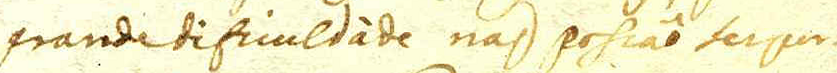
grande dificuldáde naõ possaõ ter per
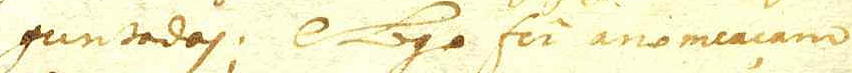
guntadas; e Logo foi a nomeaçam
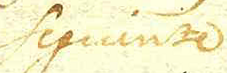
Seguinte
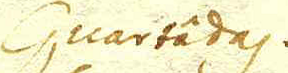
Quartâdas.
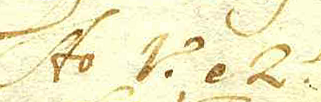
Ao 1.o, e 2.o
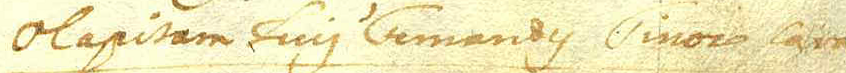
O Capitam Luis Fernandes Tinozo cara
